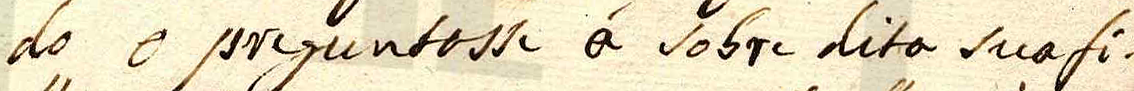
do o preguntasse á sobredita sua fi
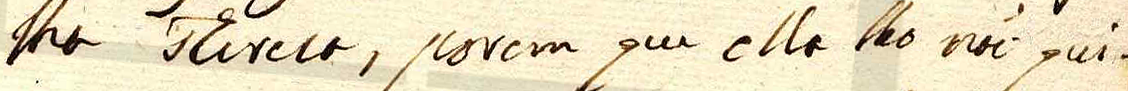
lha Thereza, porem que ella lho naõ qui
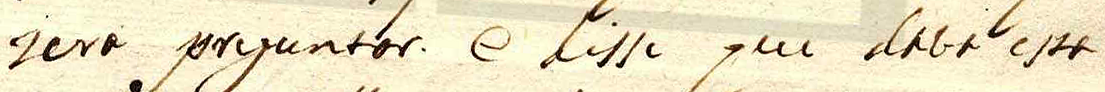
zera preguntar. e disse que dava esta
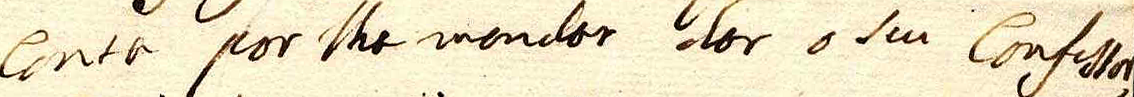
Conta por lha mandar dar o seu Confessor,
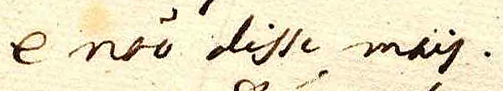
e naõ disse mais.
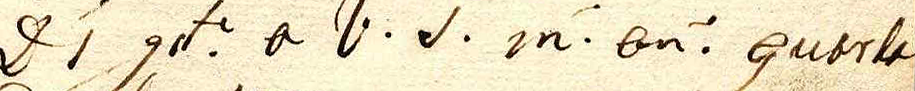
Ds̄ gd.e a V. s. m.̄ an.̄ Guarda
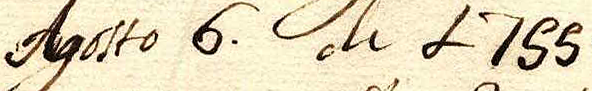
Agosto 6. de 1755.
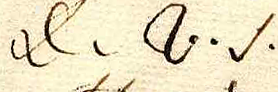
De V. S.
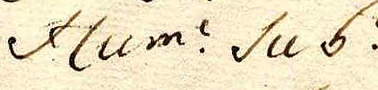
Hum.e sub.o
